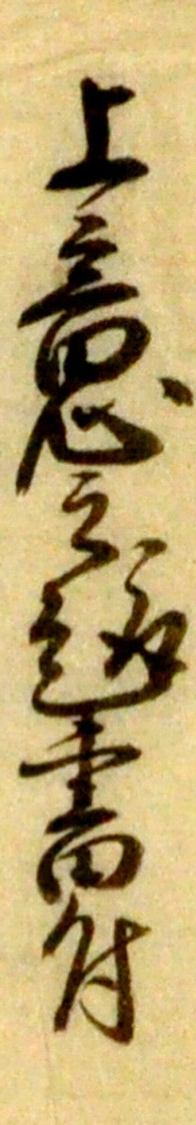上意之趣書付
